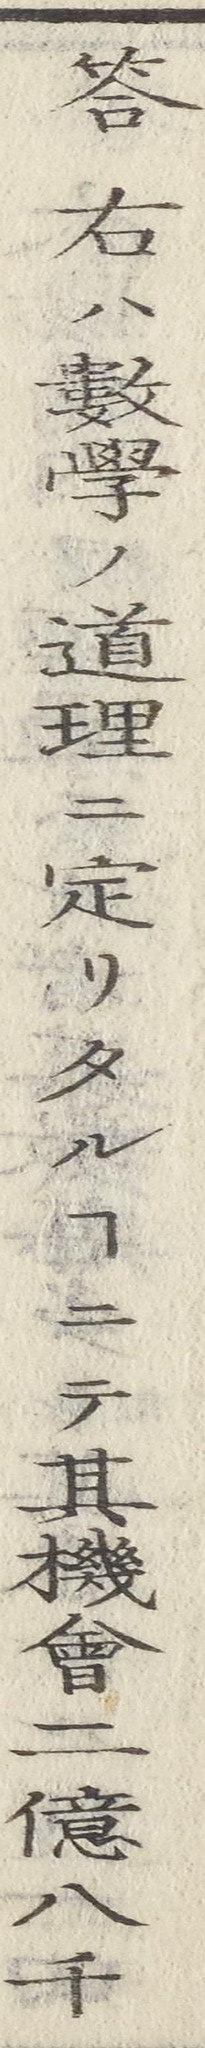答右ハ数学ノ道理ニ定リタルコトニテ其機会ニ億八千
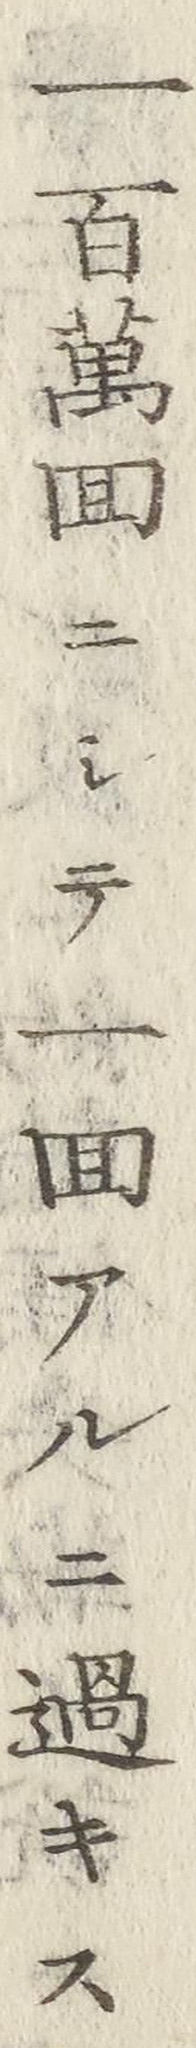一百万回ニシテ一回アルニ過キス
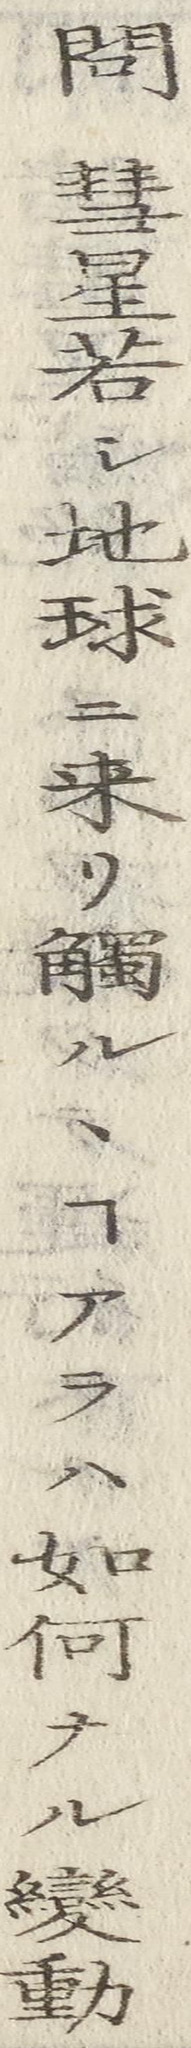問彗星若シ地球ニ来リ触ルゝコトアラハ如何ナル変動
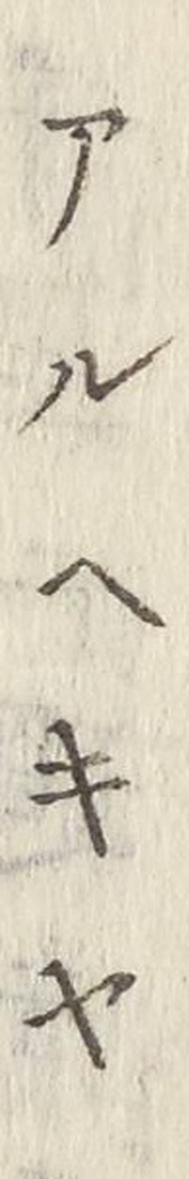アルヘキヤ
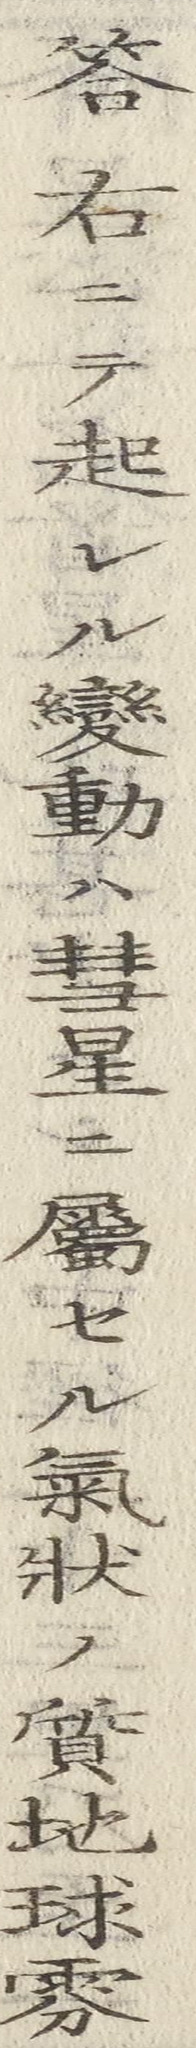答右ニテ起レル変動ハ彗星ニ属セル気状ノ質地球雰
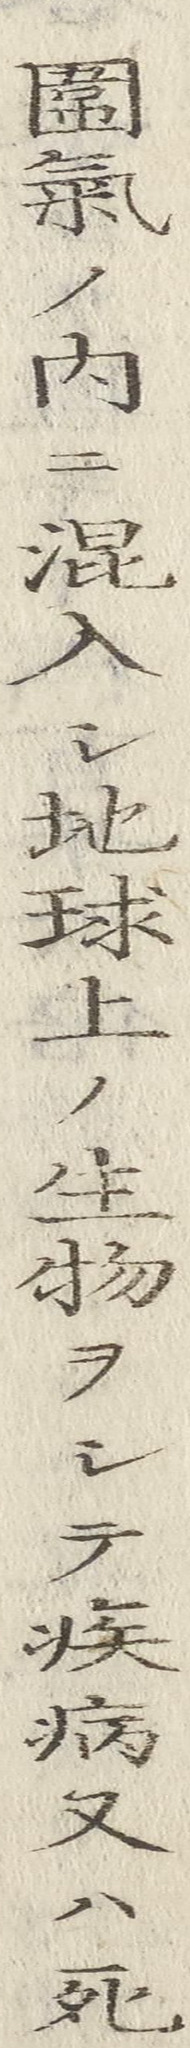囲気ノ内ニ混入シ地球上ノ生物ヲシテ疾病又ハ死
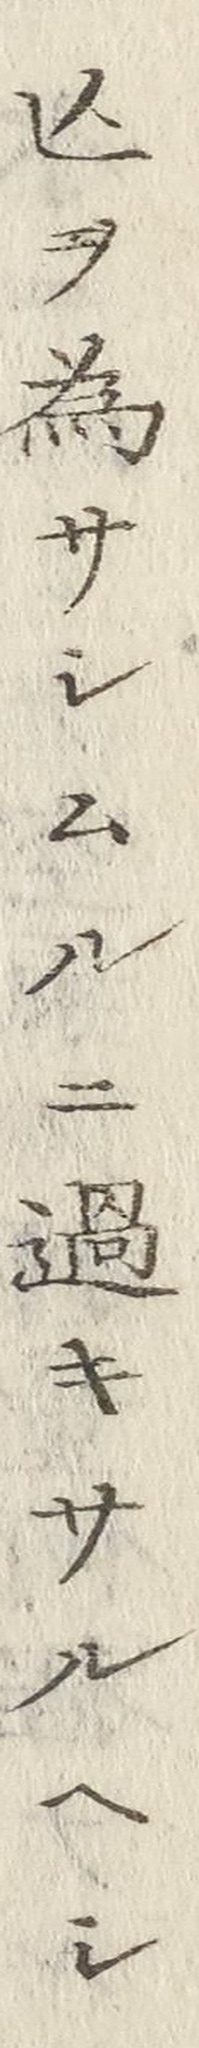亡ヲ為サシムルニ過キサルヘシ
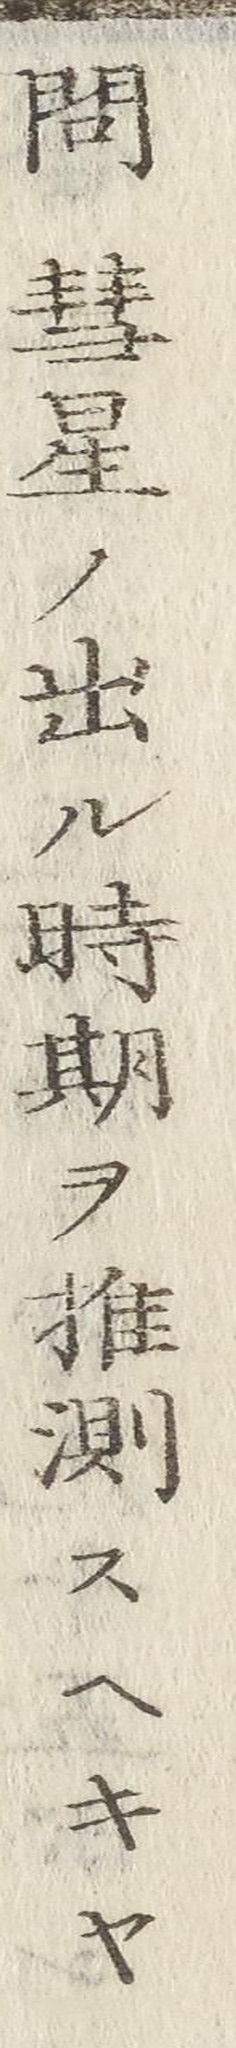問彗星ノ出ル時期ヲ推測スヘキヤ
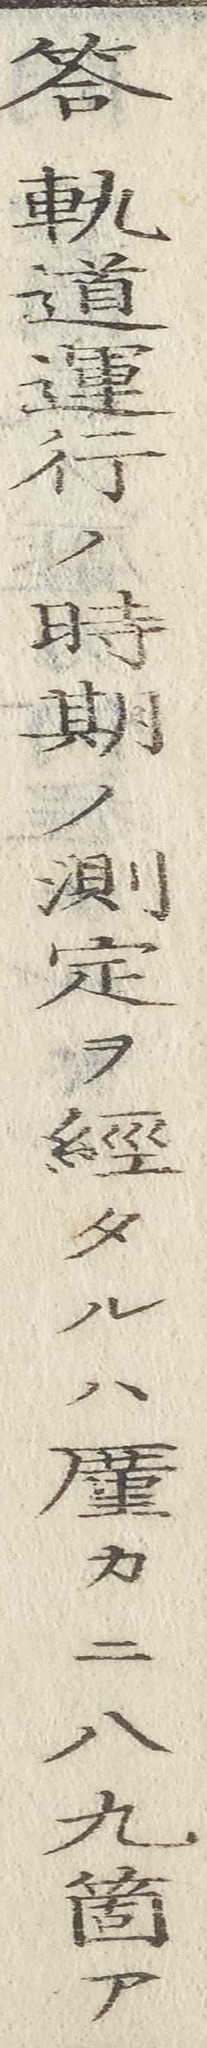答軌道運行ノ時期ノ測定ヲ経タルハ僅カニ八九箇ア
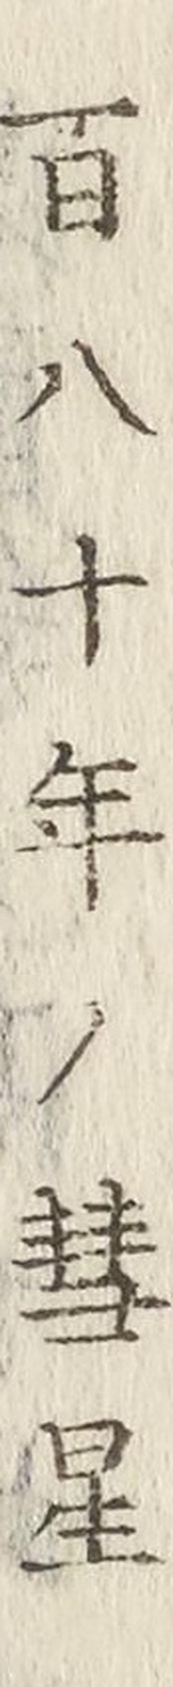百八十年ノ彗星
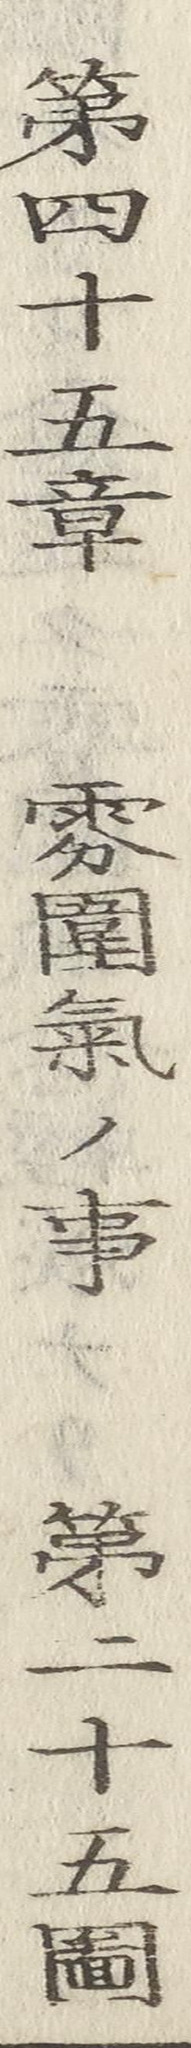第四十五章雰囲気ノ事第二十五図
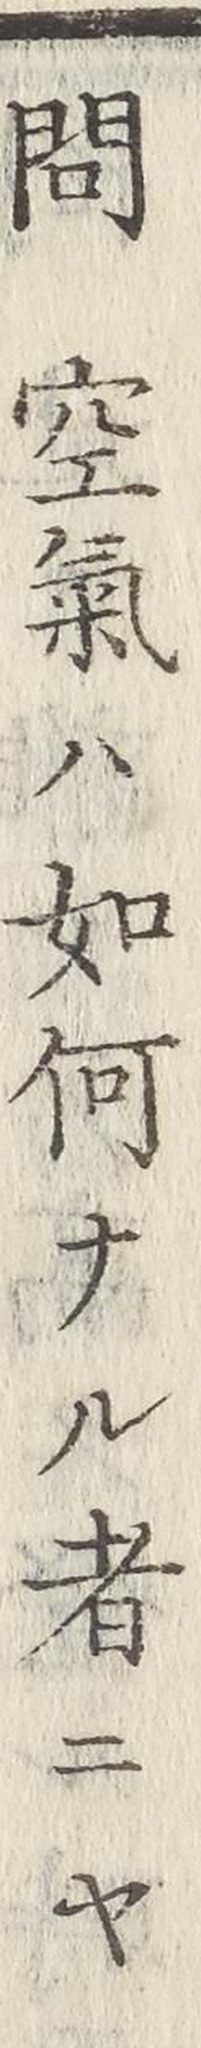問空気ハ如何ナル者ニヤ
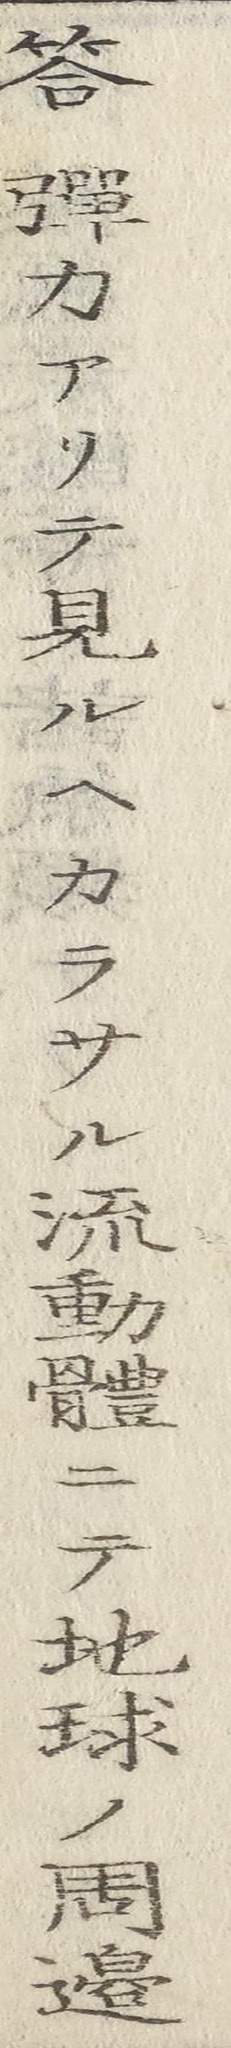答弾力アリテ見ルヘカラサル流動体ニテ地球ノ周辺
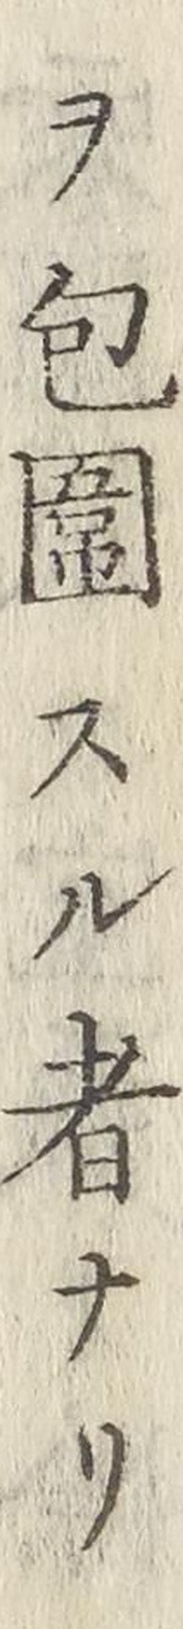ヲ包囲スル者ナリ

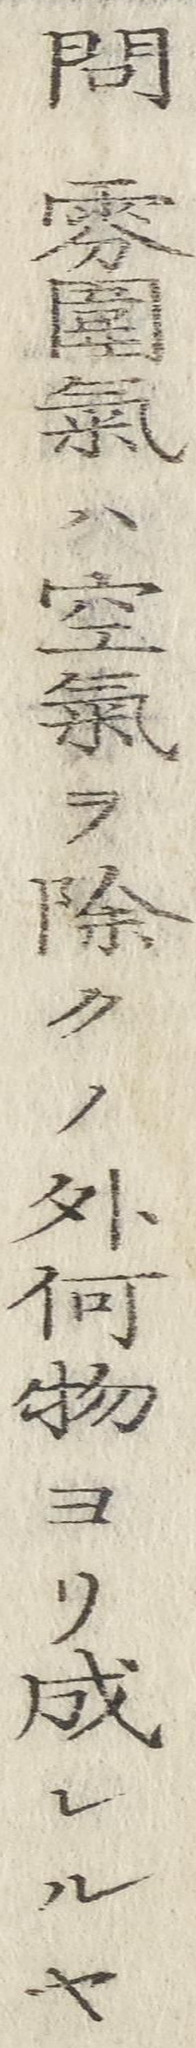問雰囲気ハ空気ヲ除クノ外何物ヨリ成レルヤ
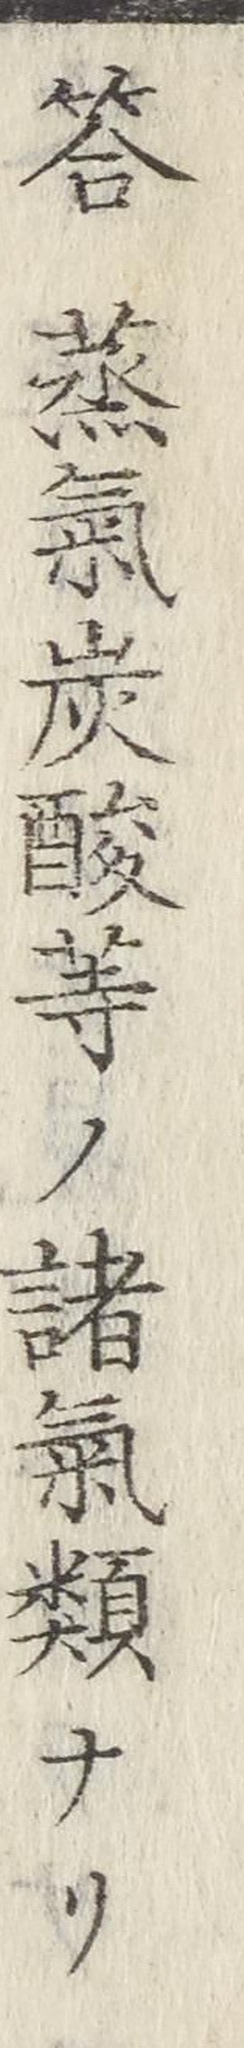答蒸気炭酸等ノ諸気類ナリ
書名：星学圖説　下
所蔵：東京大学地震研究所図書室 Earthquake Research Institute Library, The University of Tokyo, JAPAN
